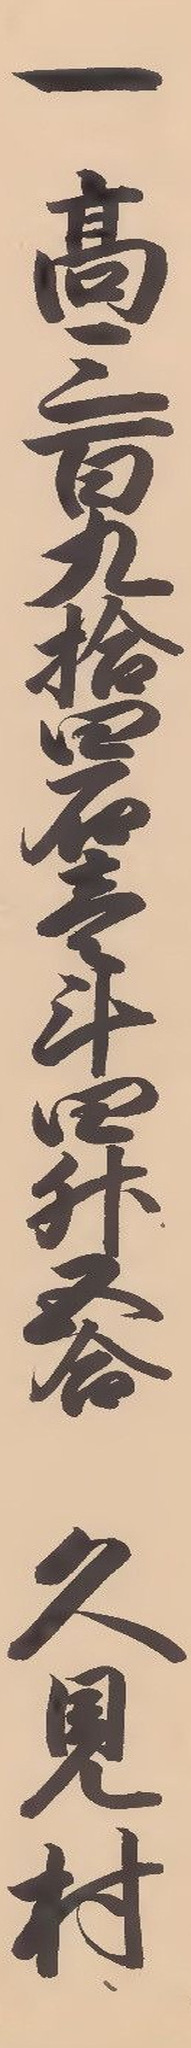一高三百九拾四石壱斗四升五合久見村
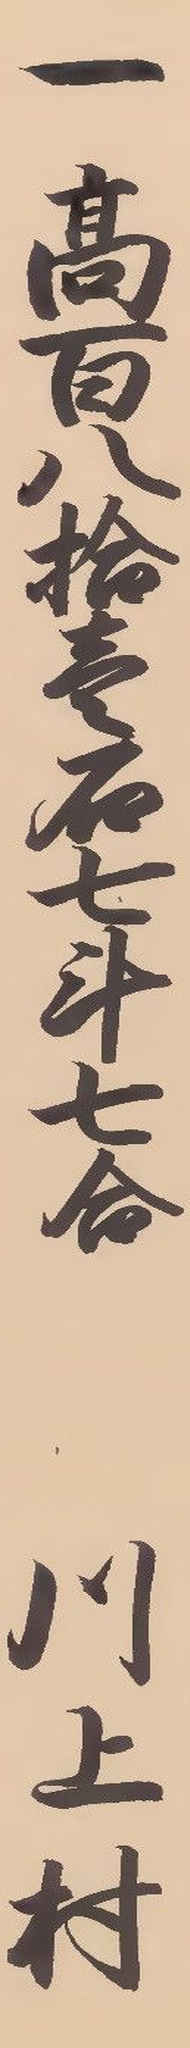一高百八拾壱石七斗七合川上村
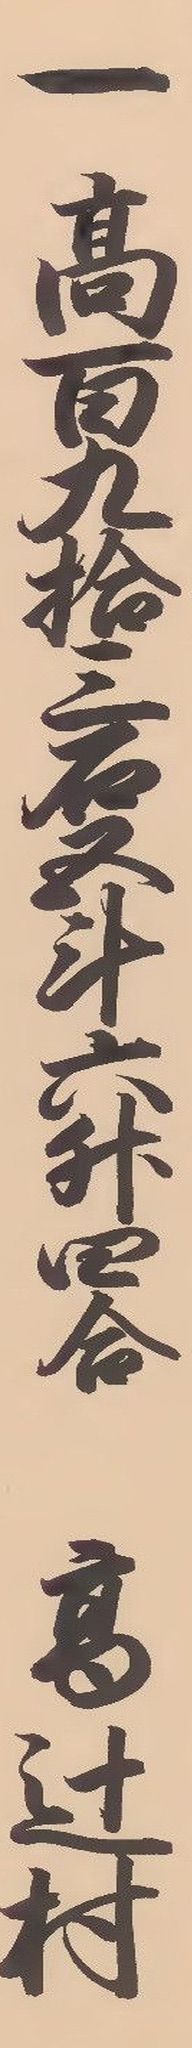一高百九拾三石五斗六升四合高辻村
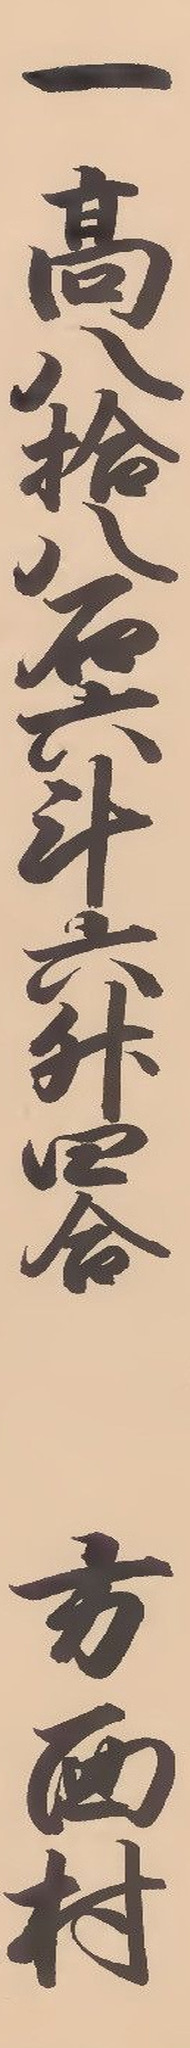一高八拾八石六斗六升四合方面村
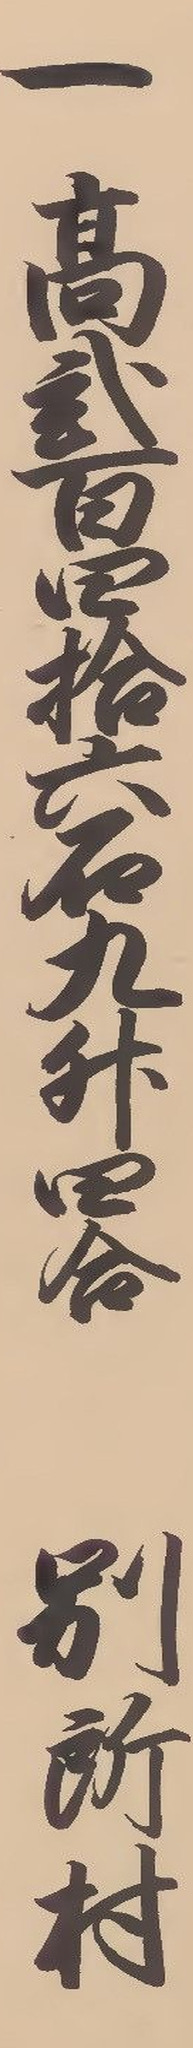一高弐百四拾六石九升四合別所村
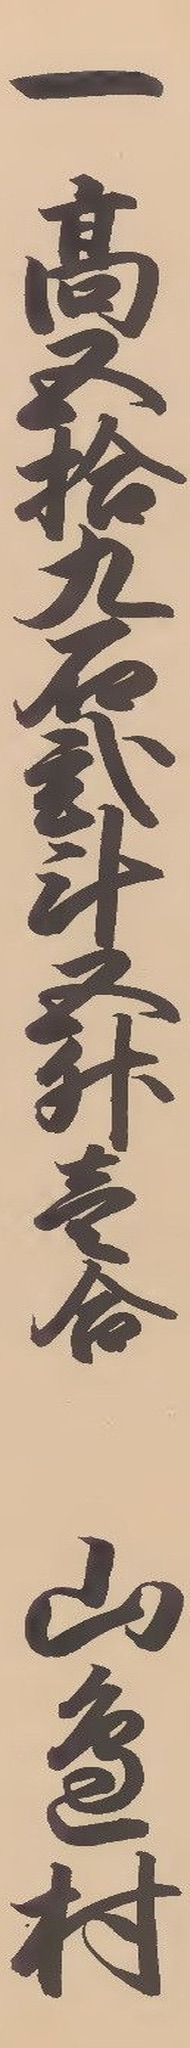一高五拾九石弐斗五升壱合山辺村
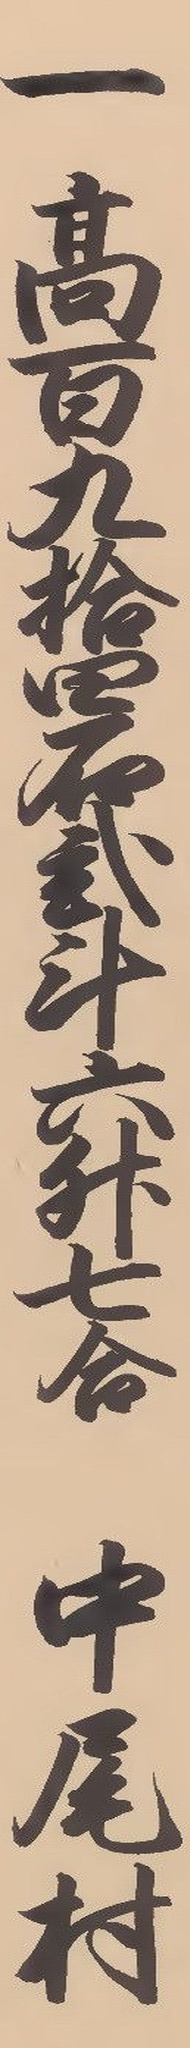一高百九拾四石弐斗六升七合中尾村
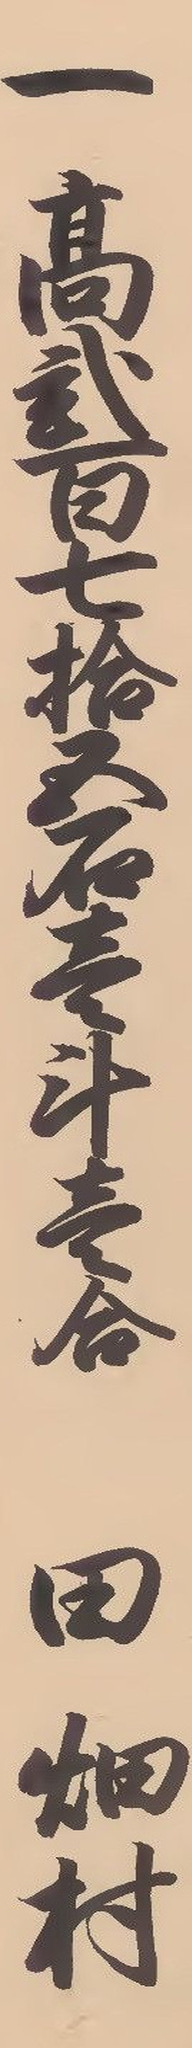一高弐百七拾五石壱斗壱合田畑村

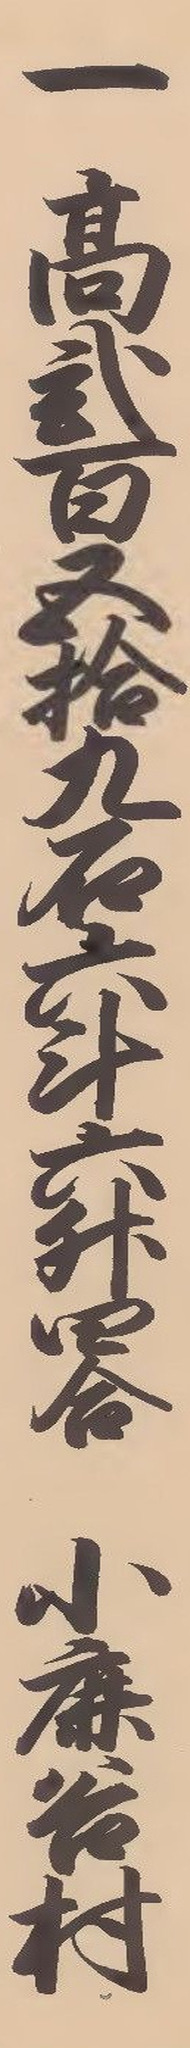一高弐百五拾九石六斗六升四合小鹿谷村
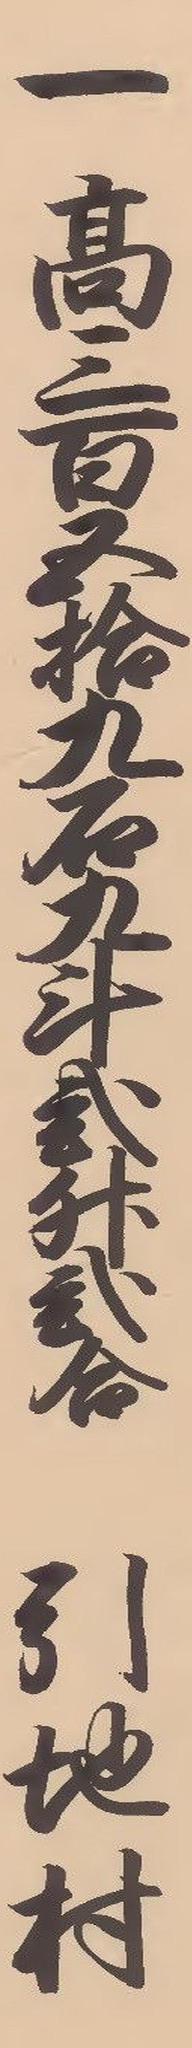一高三百五拾九石九斗弐升弐合引地村
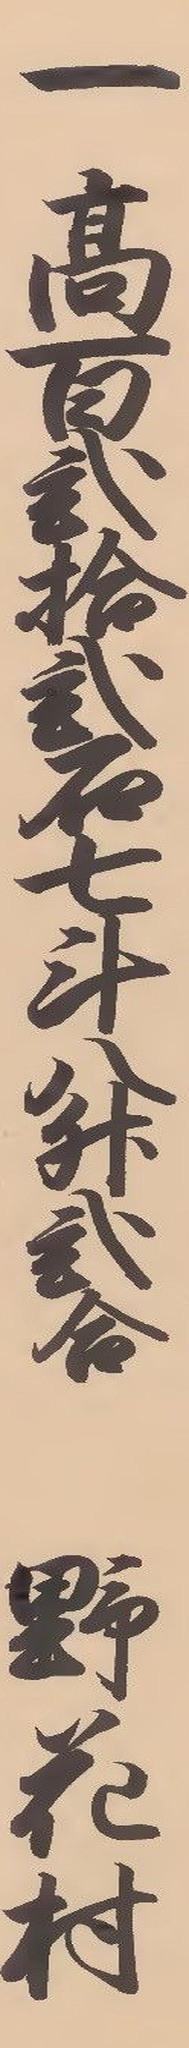一高百弐拾弐石七斗八升弐合野花村
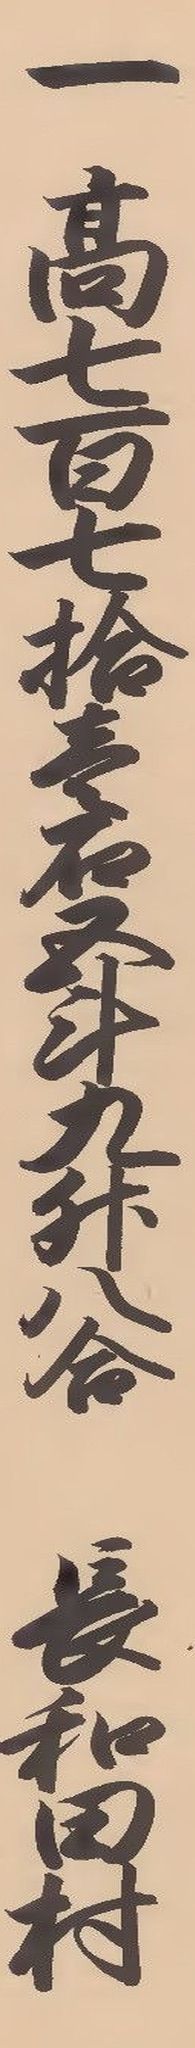一高七百七拾壱石五斗九升八合長和田村
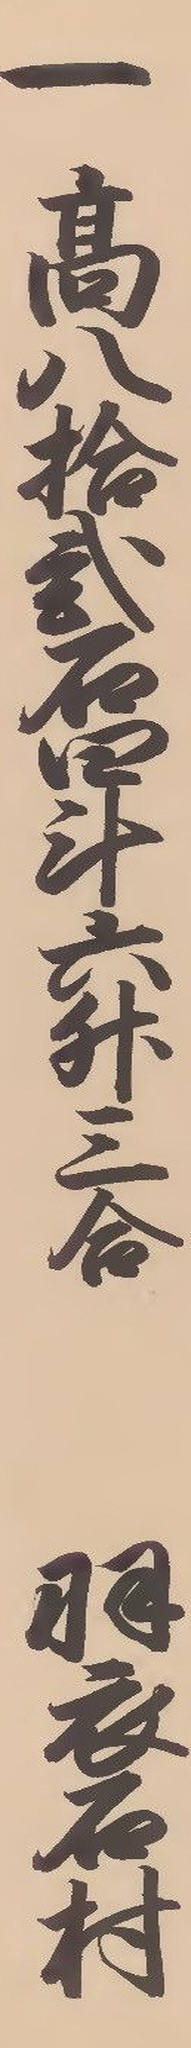一高八拾弐石四斗六升三合羽衣石村
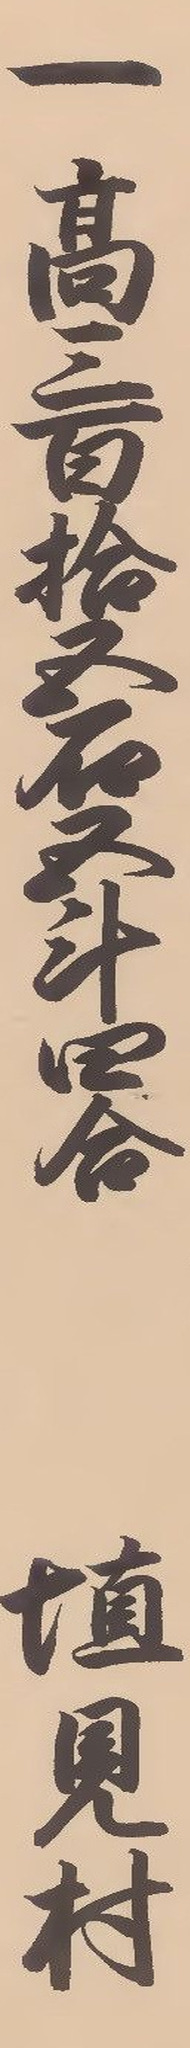一高三百拾五石五斗四合埴見村
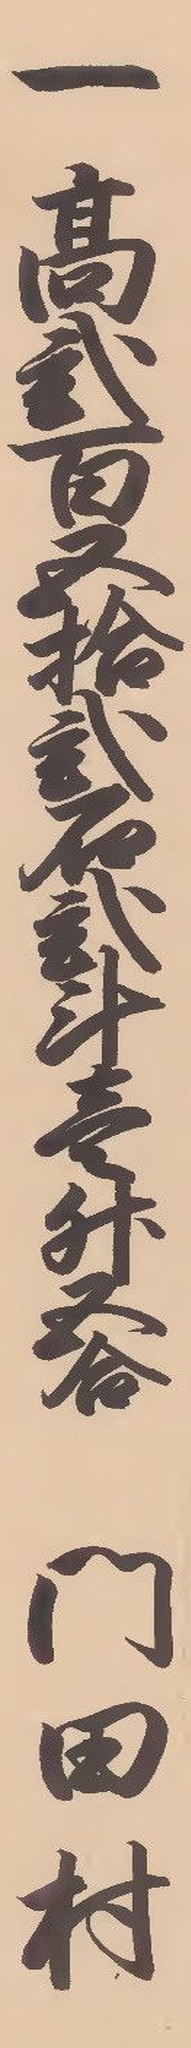一高弐百五拾弐石弐斗壱升五合門田村

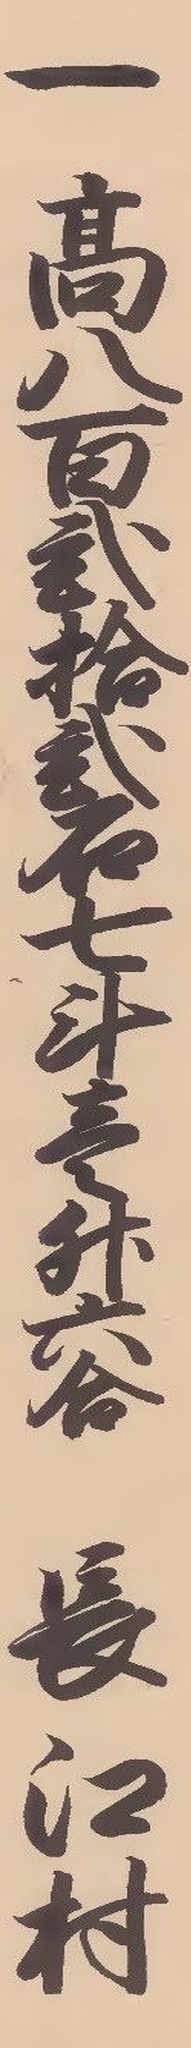一高八百弐拾弐石七斗壱升六合長江村
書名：伯耆国郷帳
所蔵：国立公文書館 National Archives of Japan
